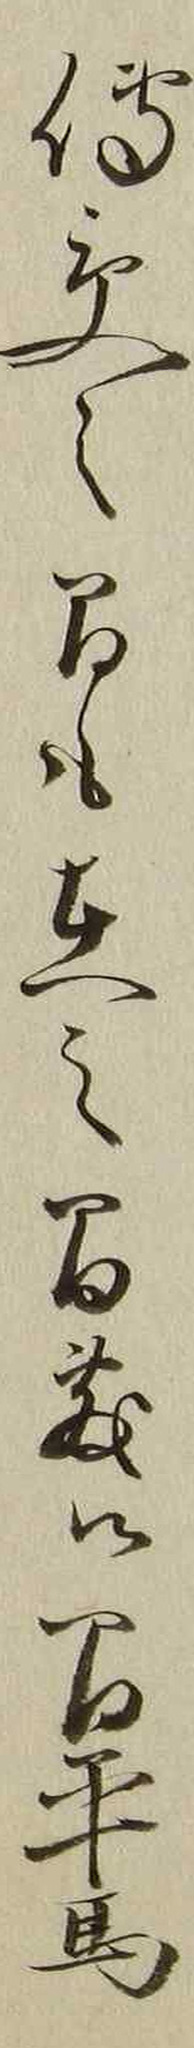伝受間も在之間敷侯間平馬
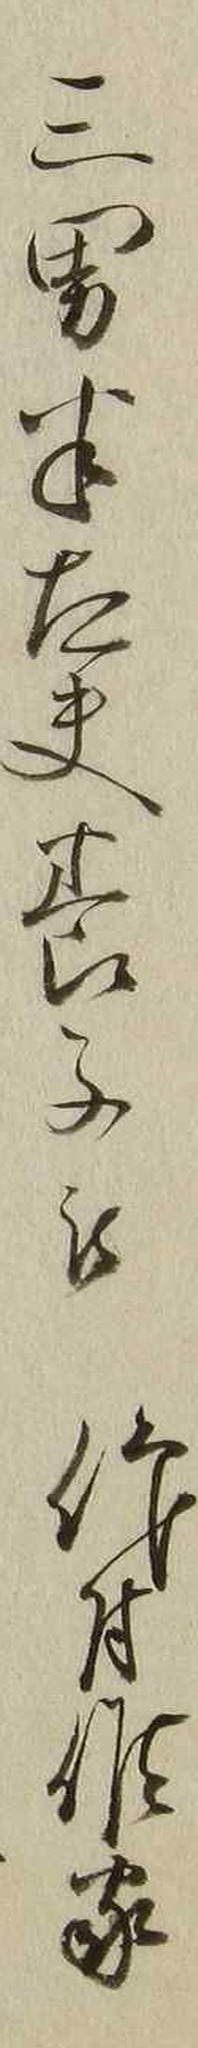三男半太夫養子被仰付候家
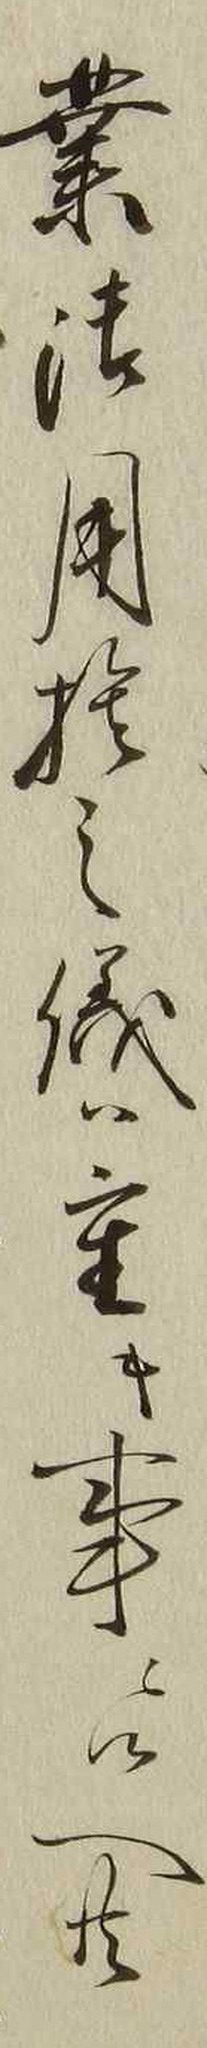業御用捨之儀は重き事に候へ共
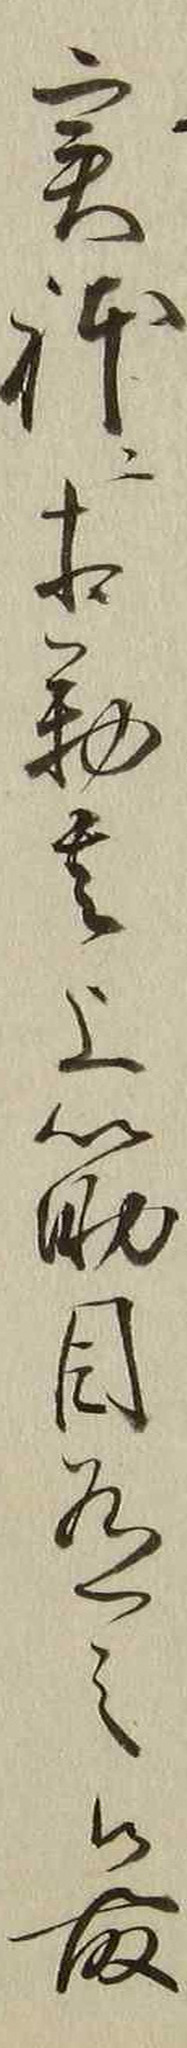実体に相勤其上筋目有之候故
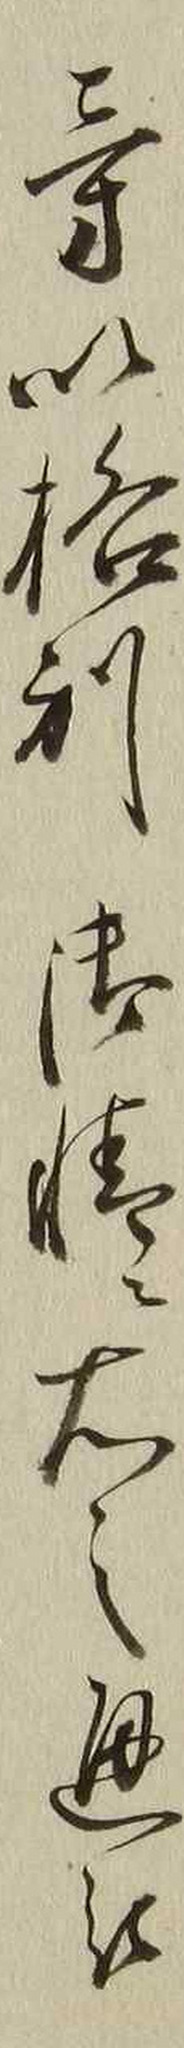旁以格別御情に右之通被
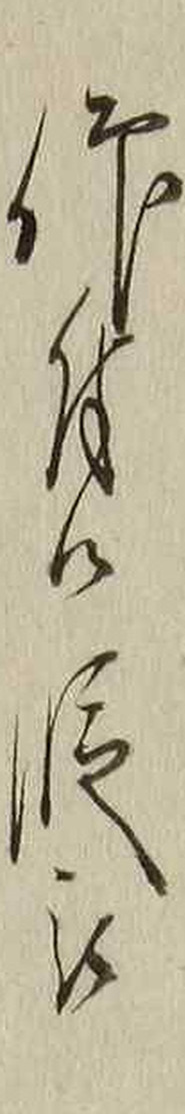仰付候段被仰出候事
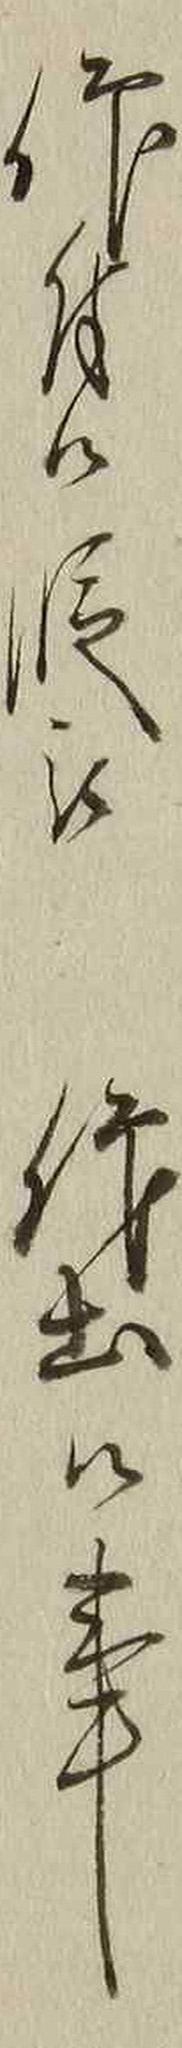仰付候段被仰出候事
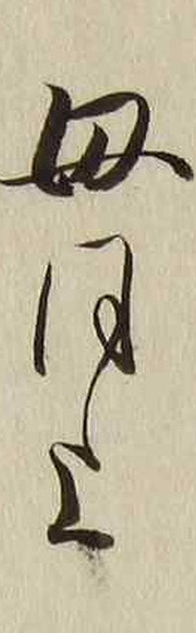母同上
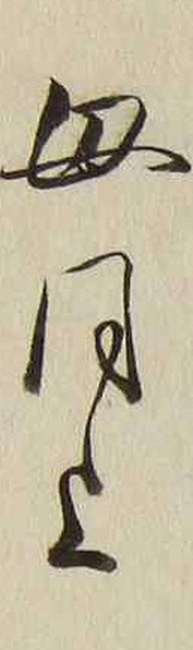母同上

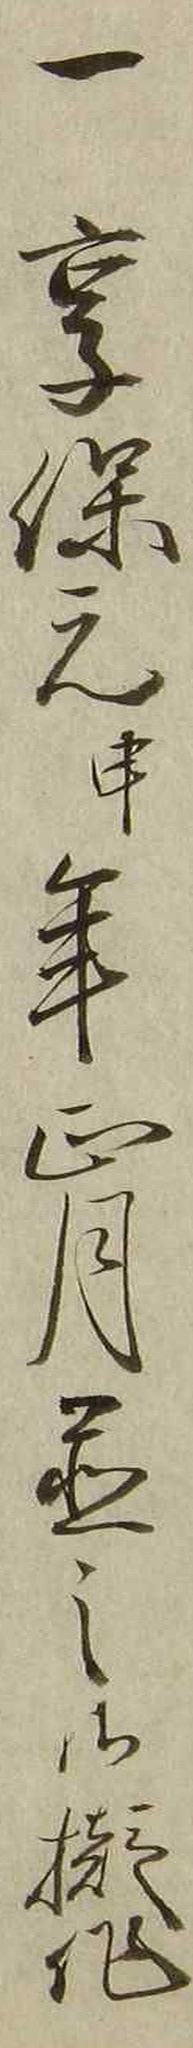一享保元申年正月並之御擬作
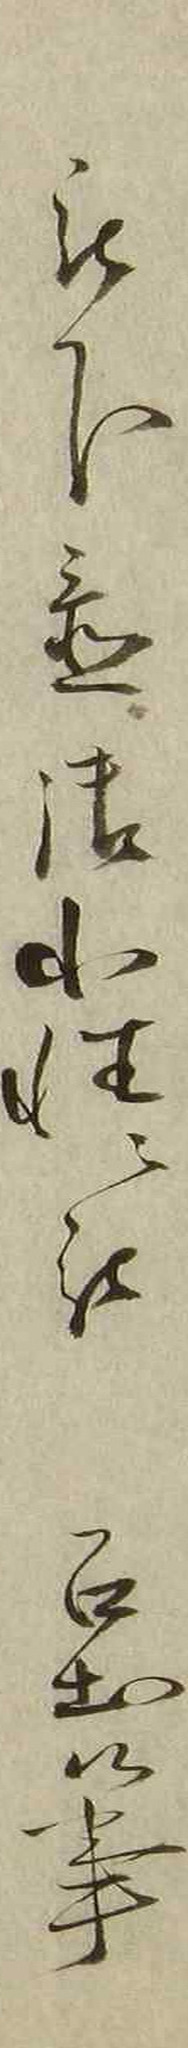被下置御小性に被召出候事
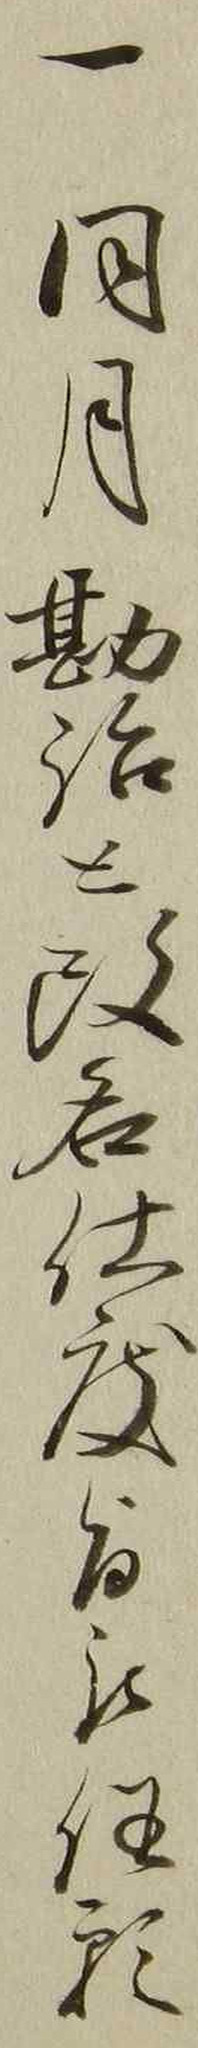一同月勘治と改名仕度旨被任願
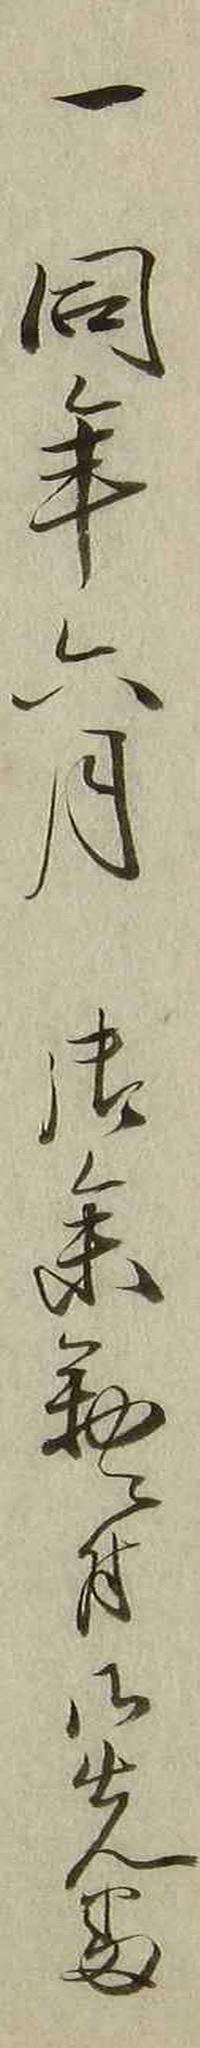一同年六月御参勤に付御先番
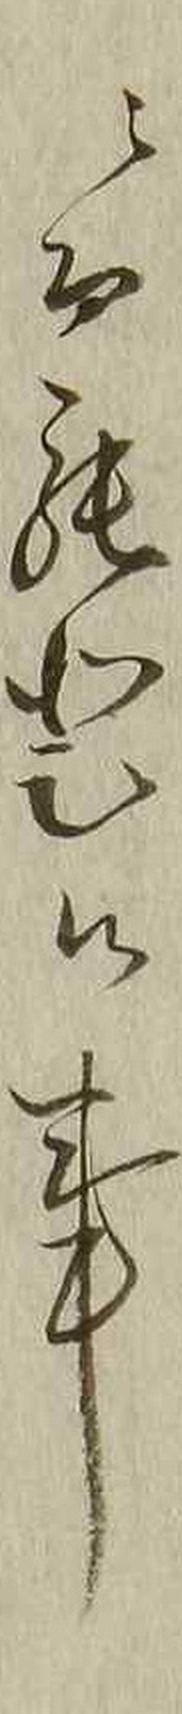に而罷登候事
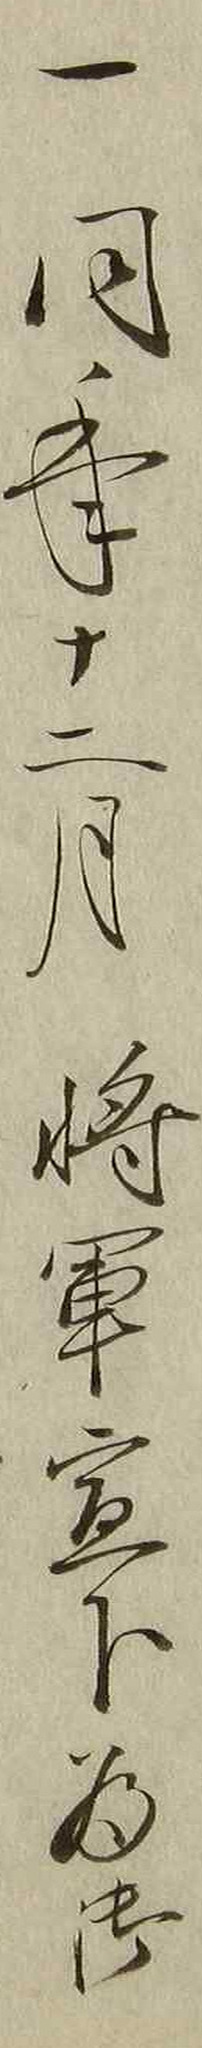一同年十二月将軍宣下為御
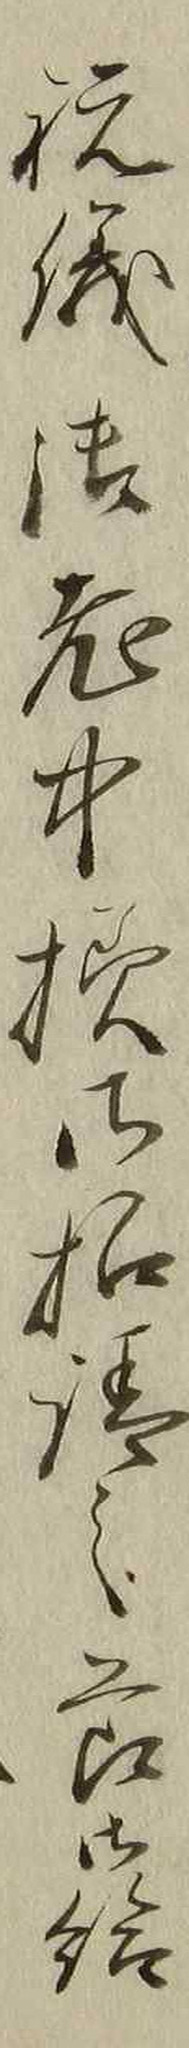祝儀御老中様御招請之節御給
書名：諸士系譜　巻之103　か之部11
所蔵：会津若松市立会津図書館
